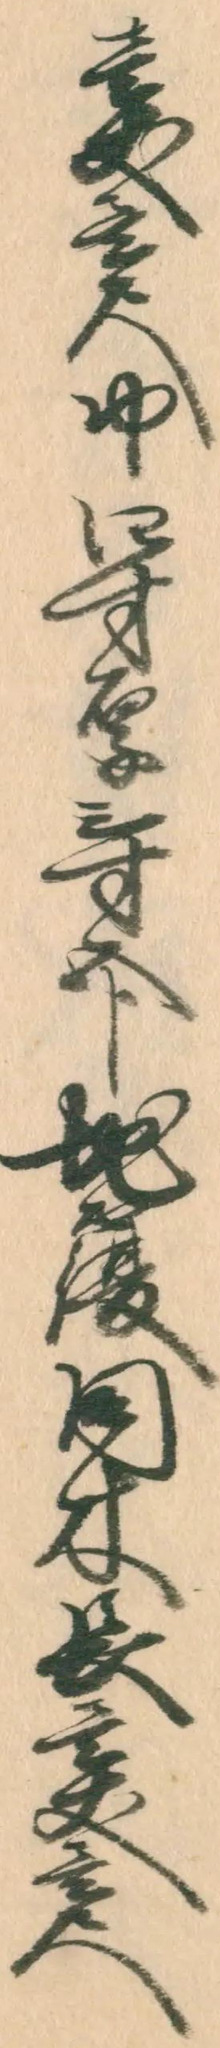壱丈壱尺巾四寸厚三寸五分地覆同木長壱丈壱寸
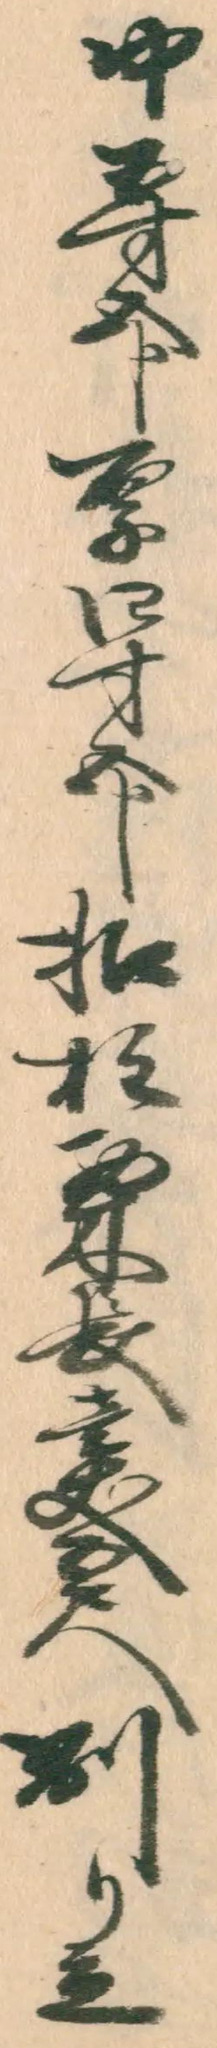巾五寸五分厚四寸五分扣柱栗長壱丈五尺削り立
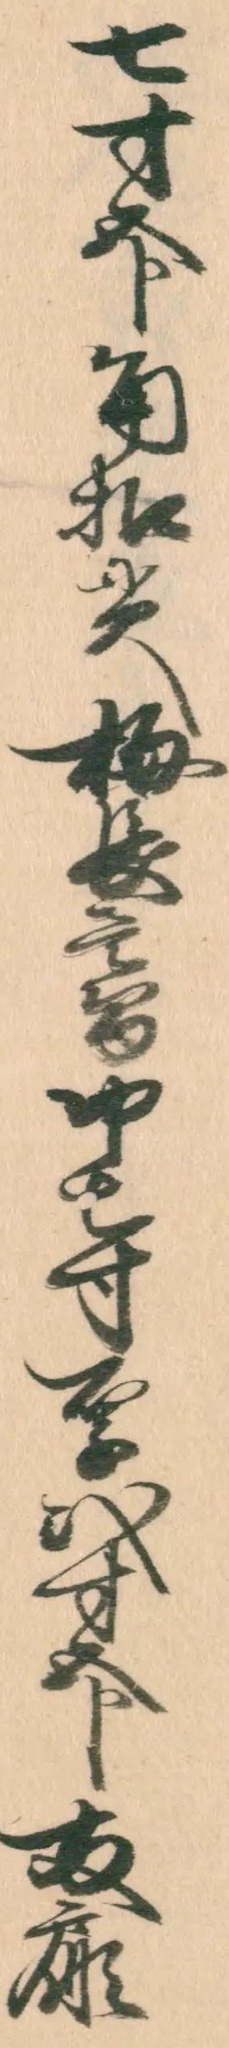七寸五分角扣貫栂長壱間巾七寸厚弐寸五分両扉
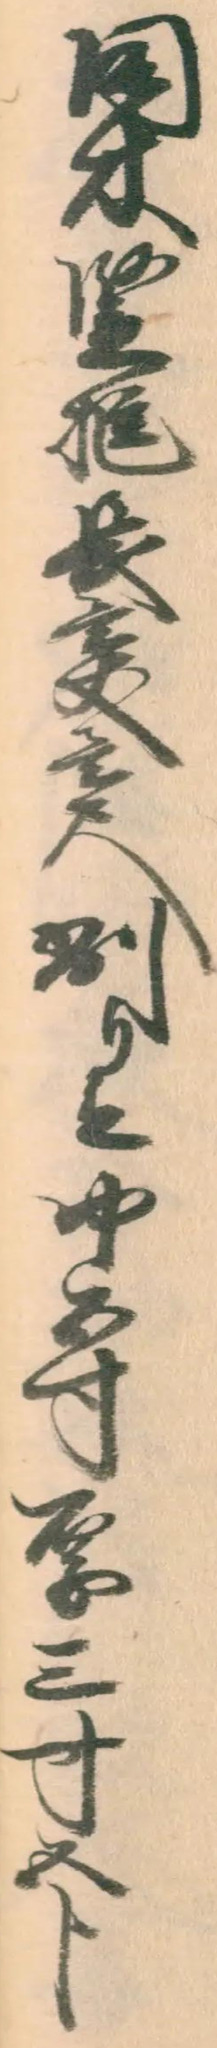同木竪框長壱丈壱尺削り立巾五寸厚三寸五分
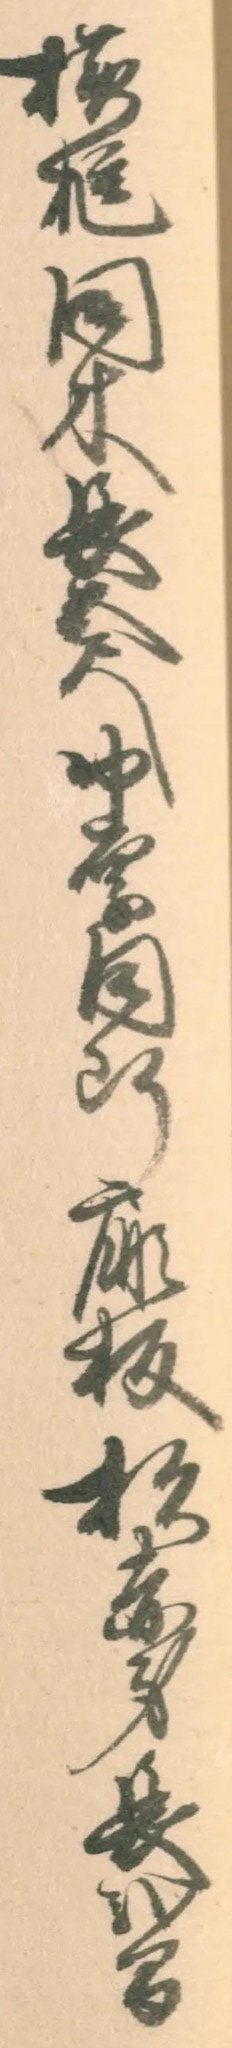横框同木長五尺巾厚同断扉板杉赤身長弐間
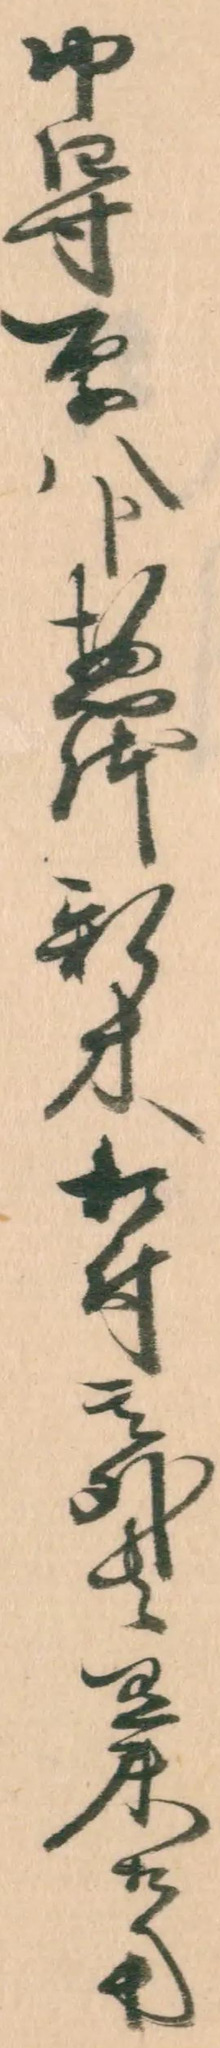巾四寸厚八分惣体新木打付其外は有来相用
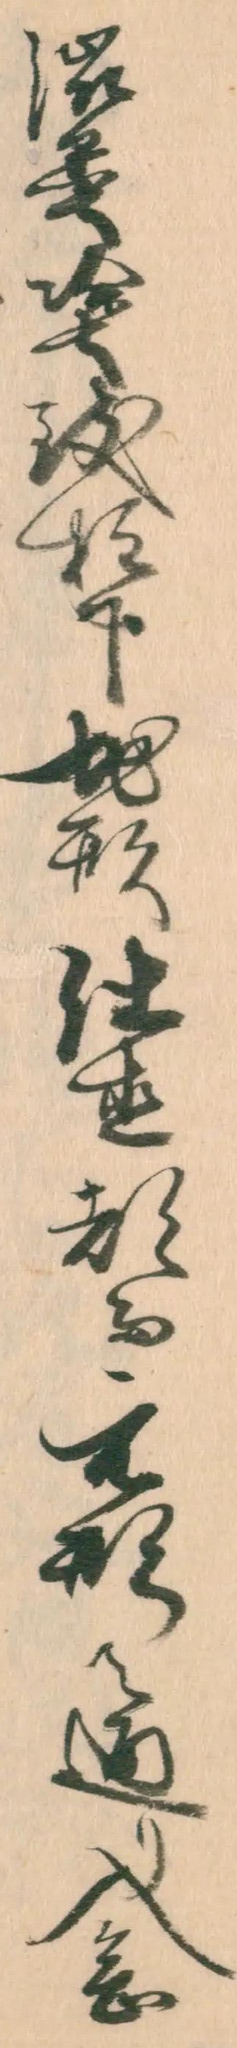渋墨塗致柱下地形仕直都而元形之通り入念
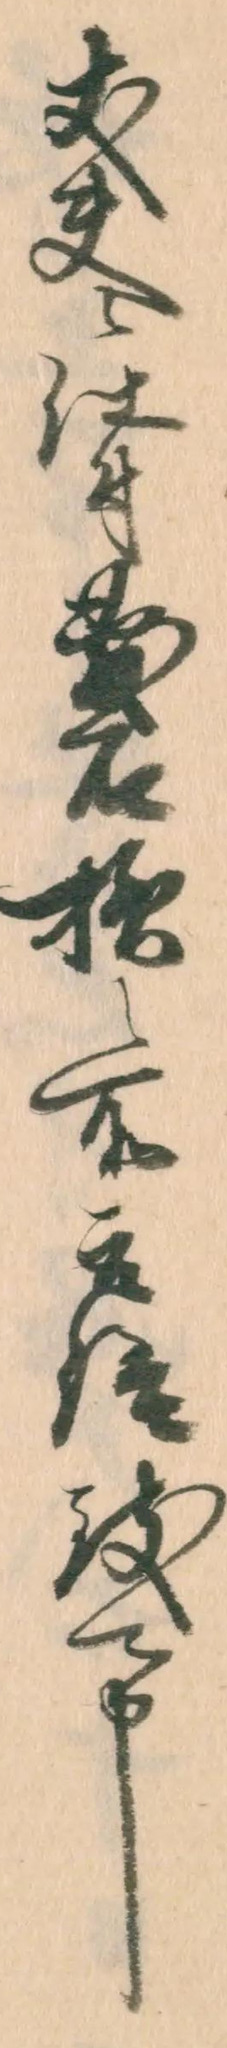丈夫に仕付敷石損之所取繕致可申候
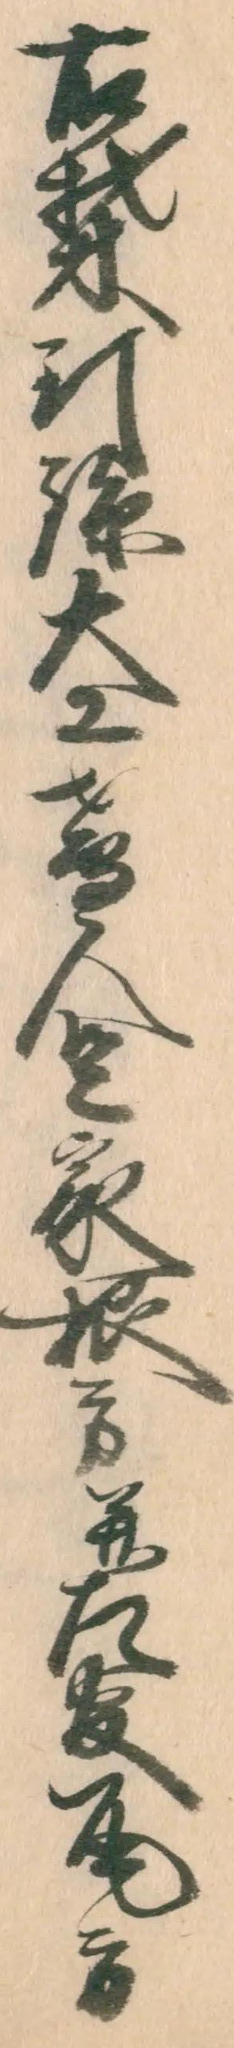右材木釘銯大工鳶人足家根方并左官瓦方

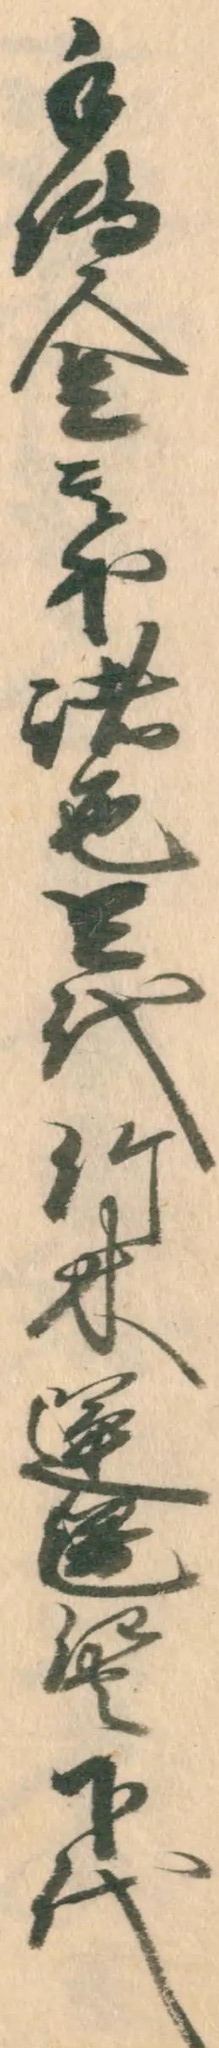手伝人足其外諸色足代竹木運送賃下代
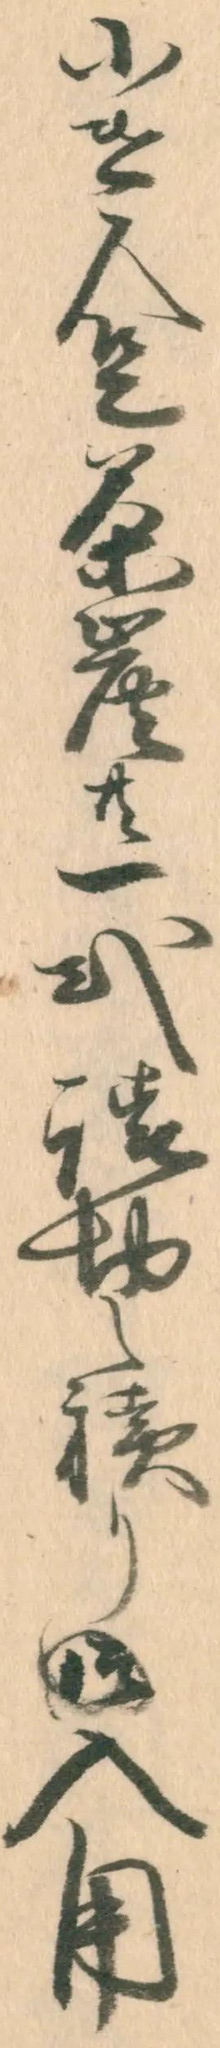小遣人足茶炭共一式請切之積り入用
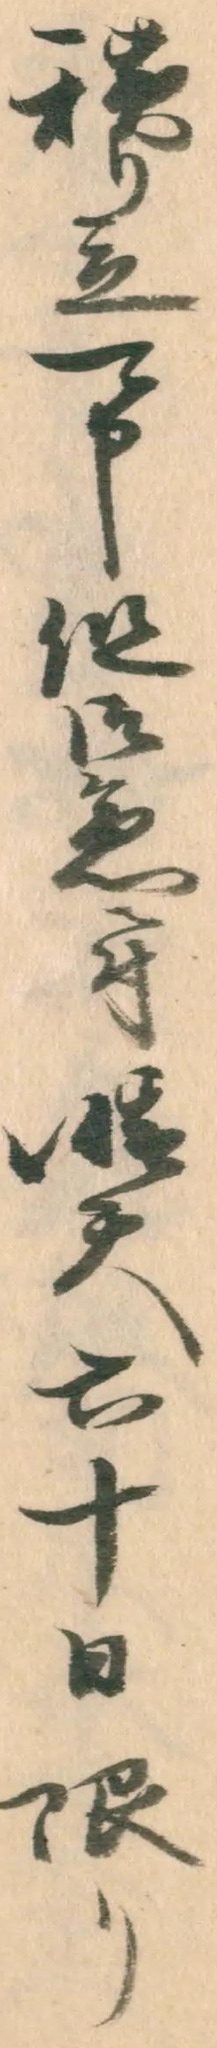積り立可申候但御急に付晴天六十日限り
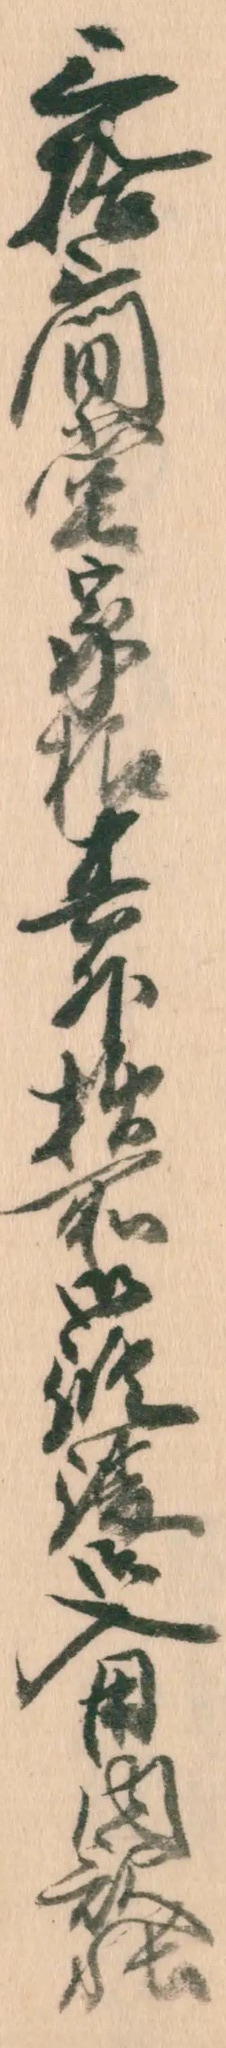三拾三間堂家根其外損所御修復御入用内訳帳

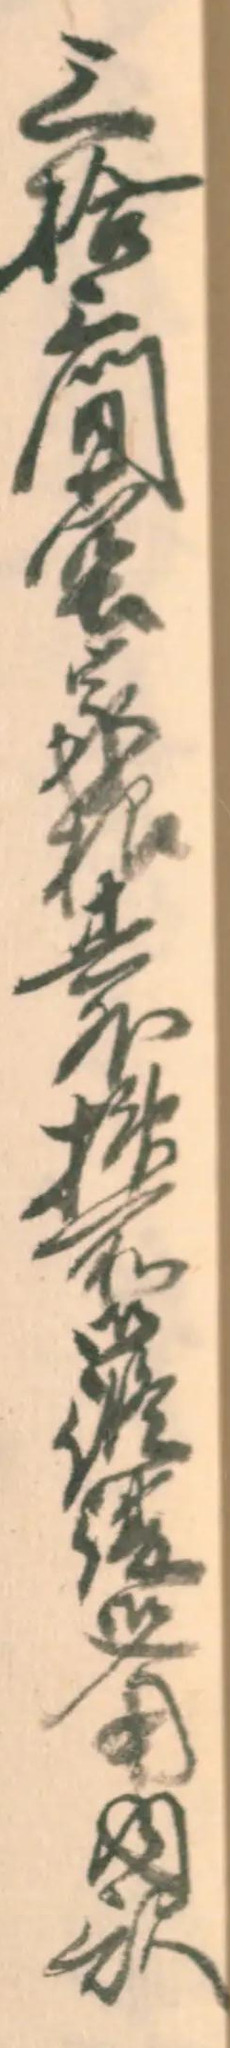三拾三間堂家根其外損所御修復御入用内訳
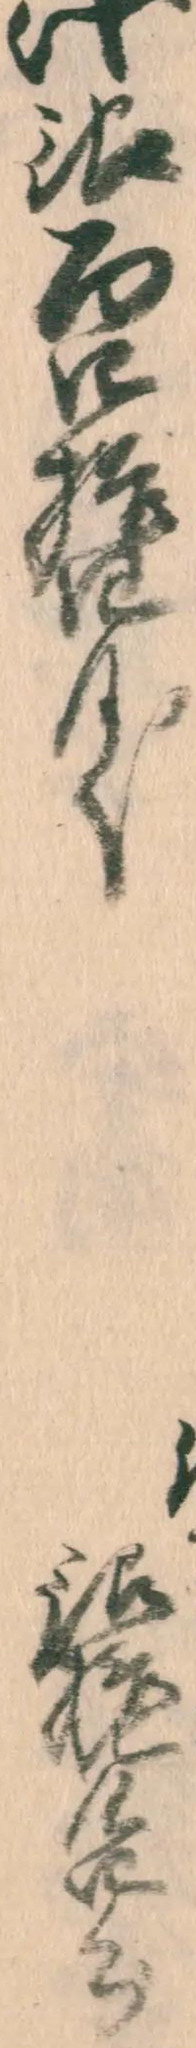代銀百四拾四匁但壱本に付
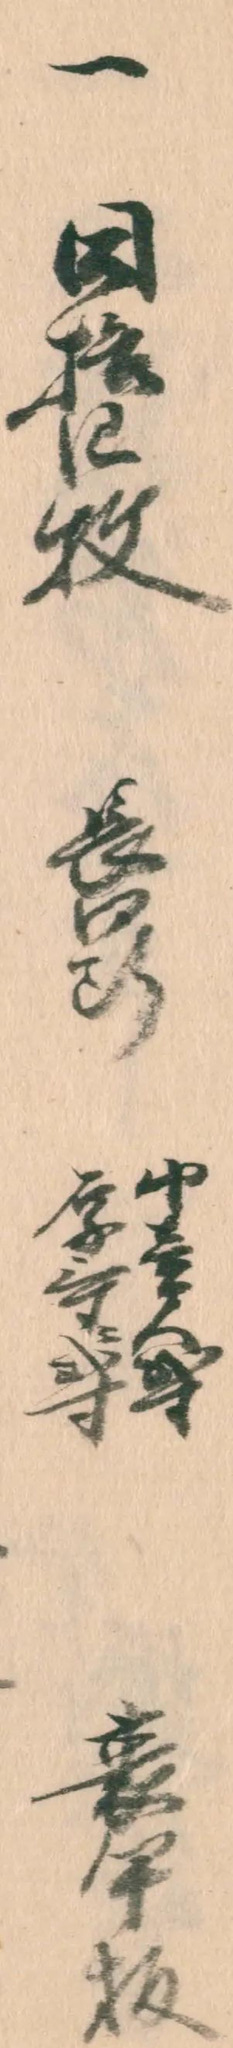一同拾四枚長同断巾壱尺弐寸裏甲板
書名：三十三間堂. [1]
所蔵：国立国会図書館 National Diet Library, JAPAN
